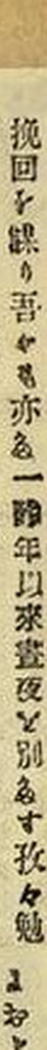挽回を謀り吾々も亦た一昨年以来昼夜を別たす孜々勉
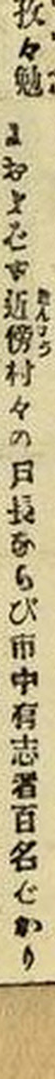におよばず近傍村々の戸長ならび市中有志者百名ばかり
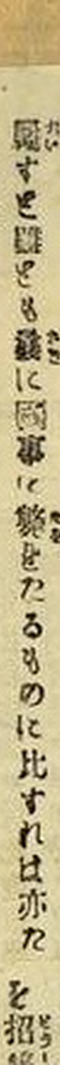励すと雖とも曩に国事に斃れたるものに比すれは亦た
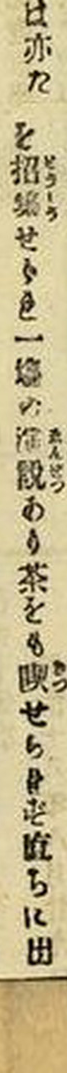を招集せられ一場の演説あり茶をも喫せられず直ちに出
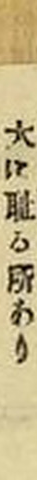大に耻る所あり
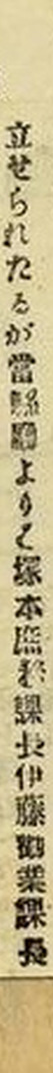立せられたるが当県庁よりは塚本庶務課長伊藤勧業課長
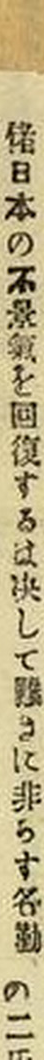偖日本の不景気を回復するは決して難きに非らす各勤
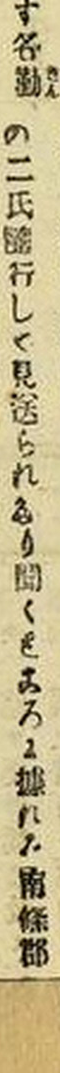の二氏随行して見送られたり聞くところに拠れは南條郡
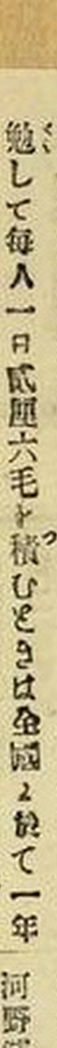勉して毎人一日弐厘六毛を積むときは全国に於て一年
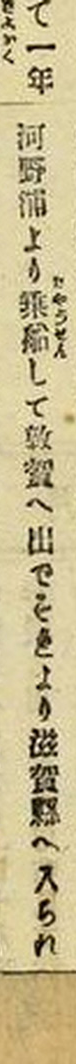河野浦より乗船して敦賀へ出でそれより滋賀県へ入られ
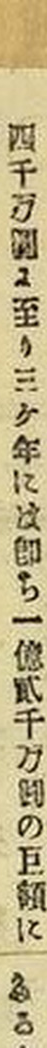四千万円に至り三ケ年には即ち一億弐千万円の巨額に
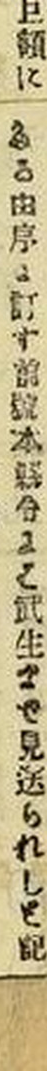たる由序に訂す前号本県令には武生まで見送られしと記
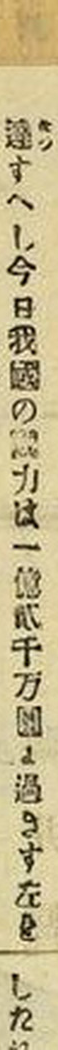達すへし今日我国の国力は一億弐千万円に過きす左れ
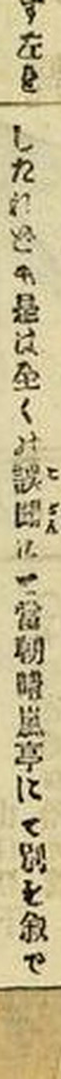したれども是は全くの誤聞にて当朝晴嵐亭にて別を叙で
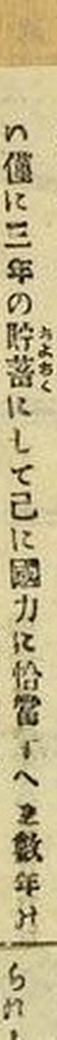は僅に三年の貯蓄にして已に国力に恰当すへき数年の
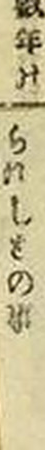られしとの事
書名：温古集 五巻
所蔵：福井県文書館 Fukui Prefectural Archives
